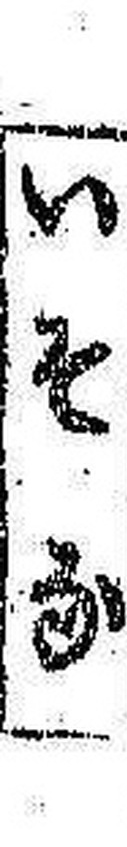いそな
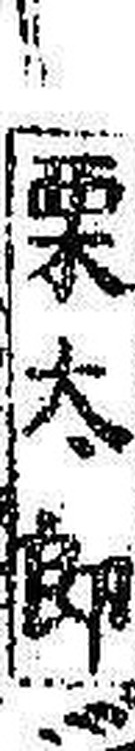栗太郎
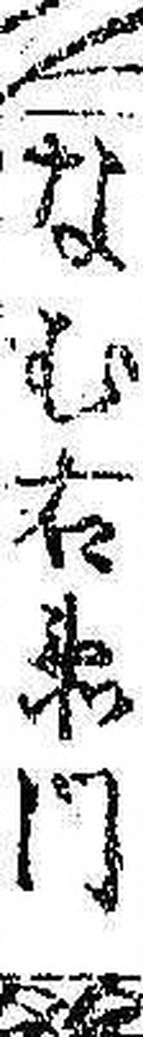なむ右衛門

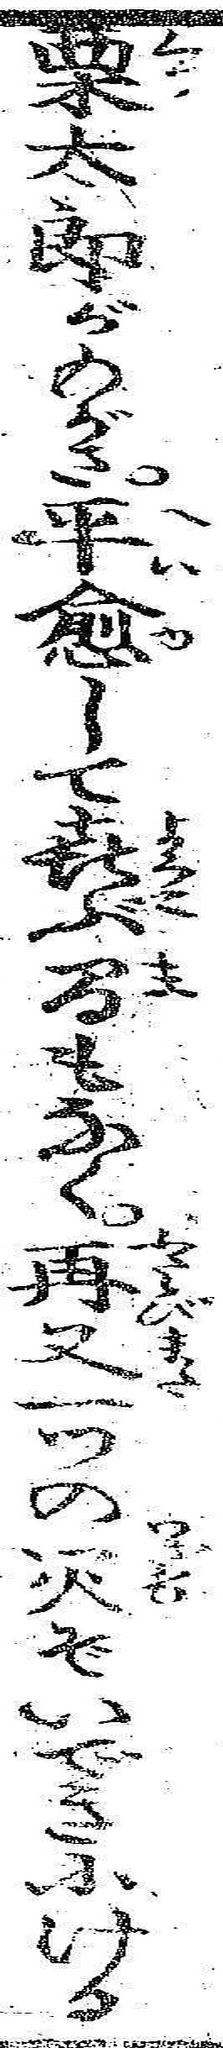栗太郎がもがさ。平癒して喜ぶ間もなく。再又一つの災ぞいできにける
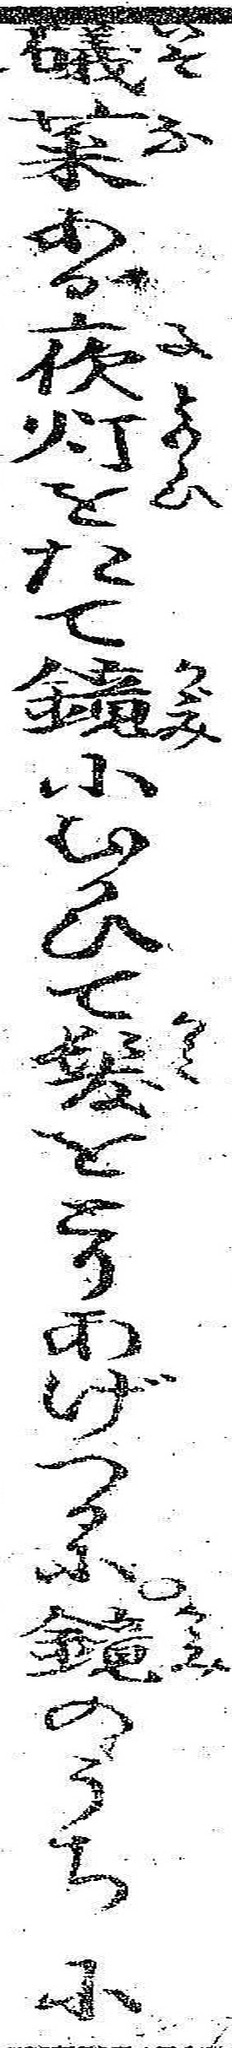磯菜ある夜灯をたて鏡にむかひて髪をとりあげつるに。鏡のうちに
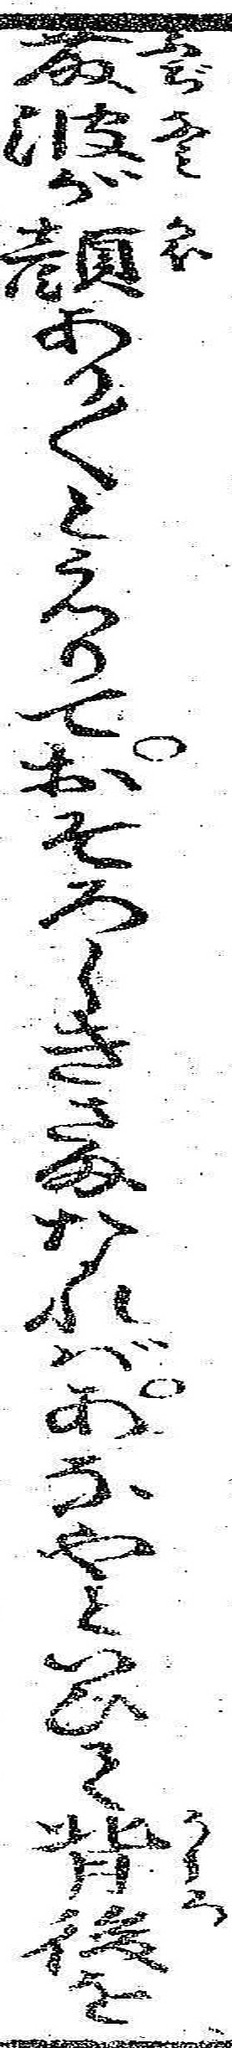藤波が顔あり〳〵とうつりて。おそろしきさまなれば。あなやといひて背後を
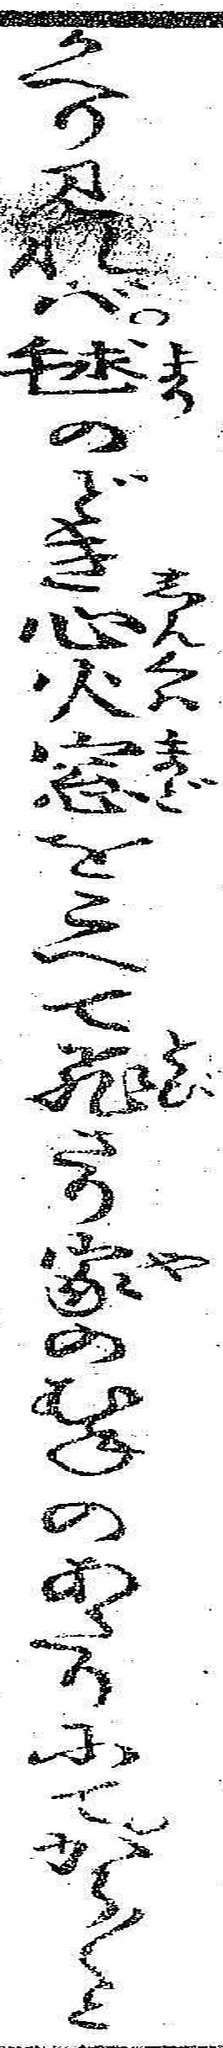かへり見れば。毬のごとき心火窓をこへて飛さり家のむねのあたりにて。から〳〵と
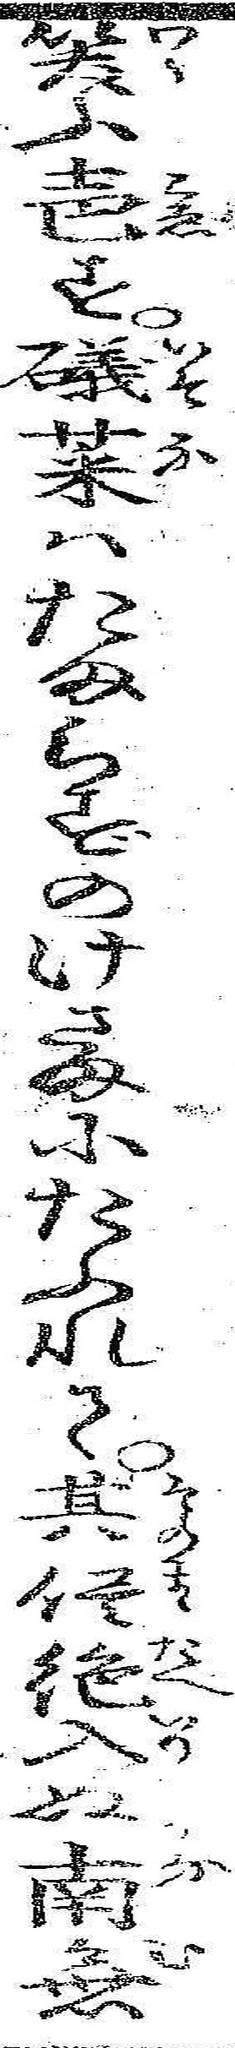笑ふ声す。磯菜はたまらずのけさまにたふれて。其侭絶入ぬ。南無
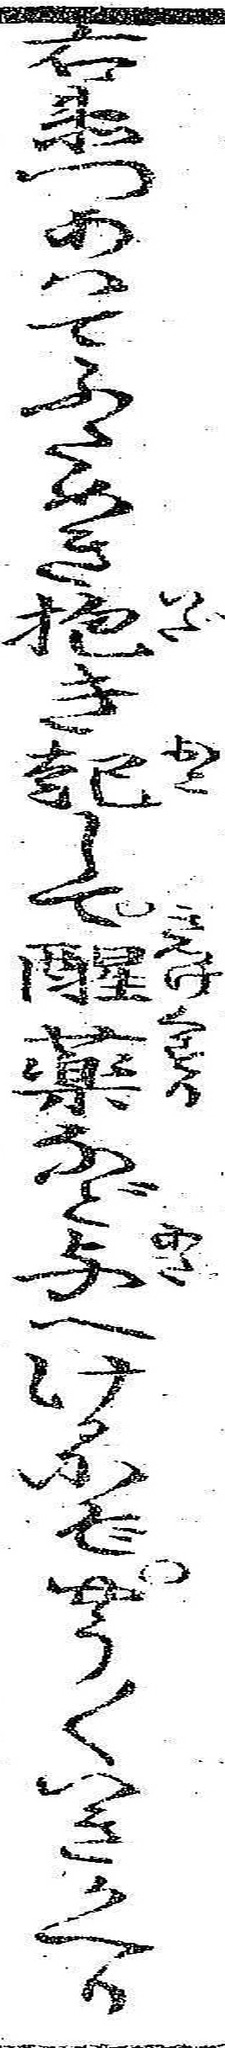右衛門あはてふためき抱き起して。醒薬など与へけるにぞ。やう〳〵いきかへり
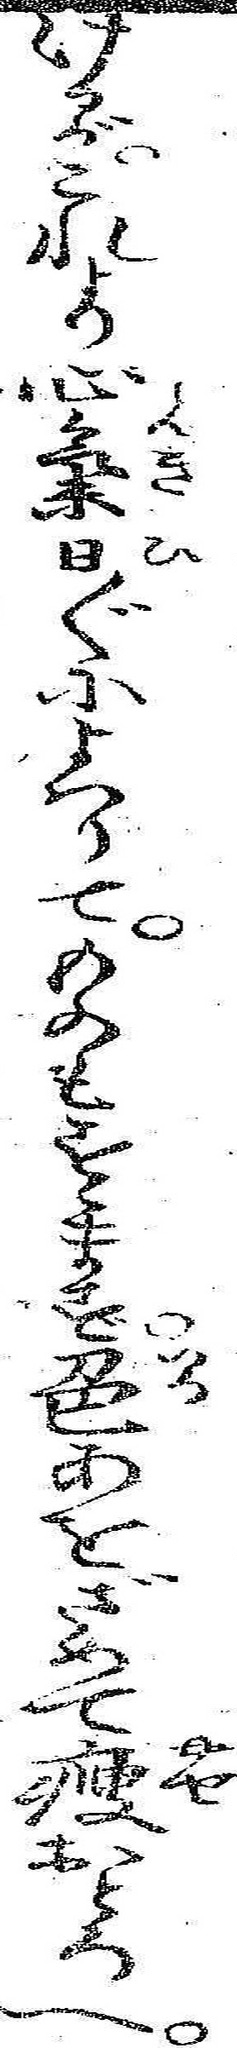けるが。これより心気日々によはりて。ものもすゝまず。色あをざめて痩おとろへ。
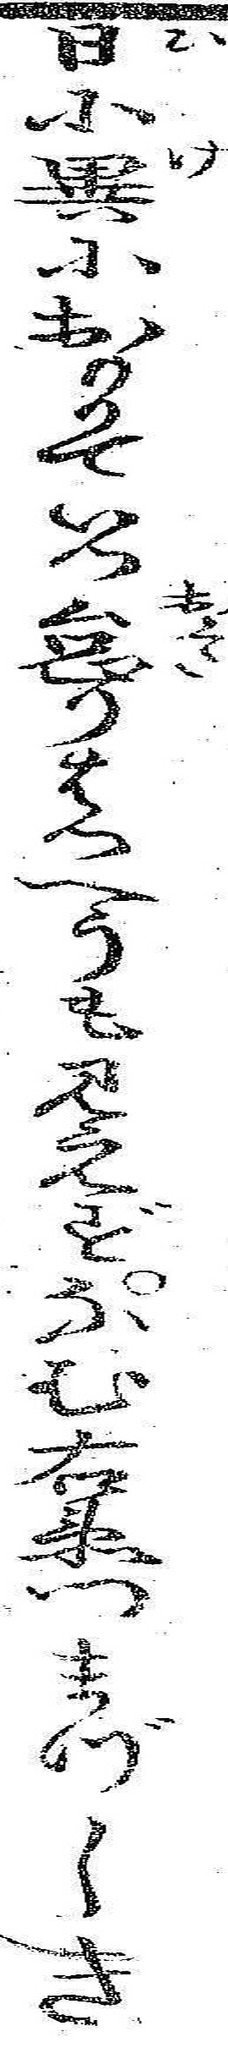日に異におもりていつ怠りはつへうも見えず。なむ右衛門まづしき
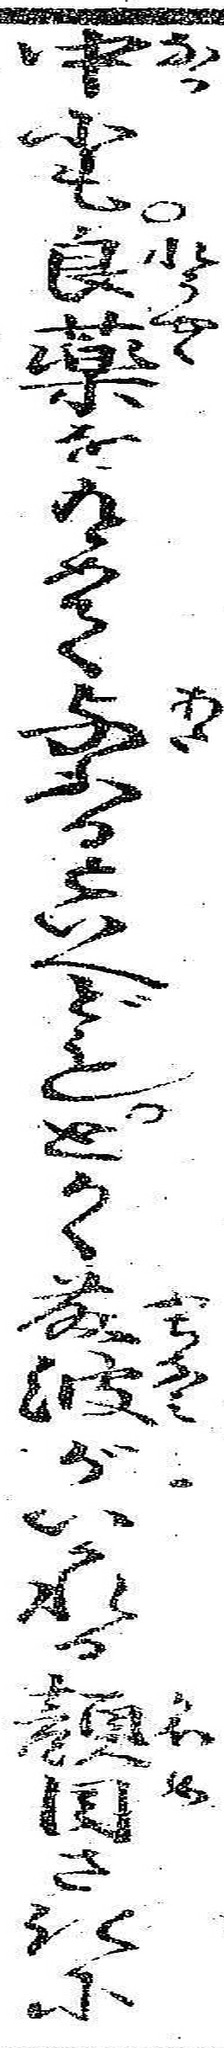中にも。良薬をもとめて与ふるといへども。とかく藤波がいかれる顔目さきに
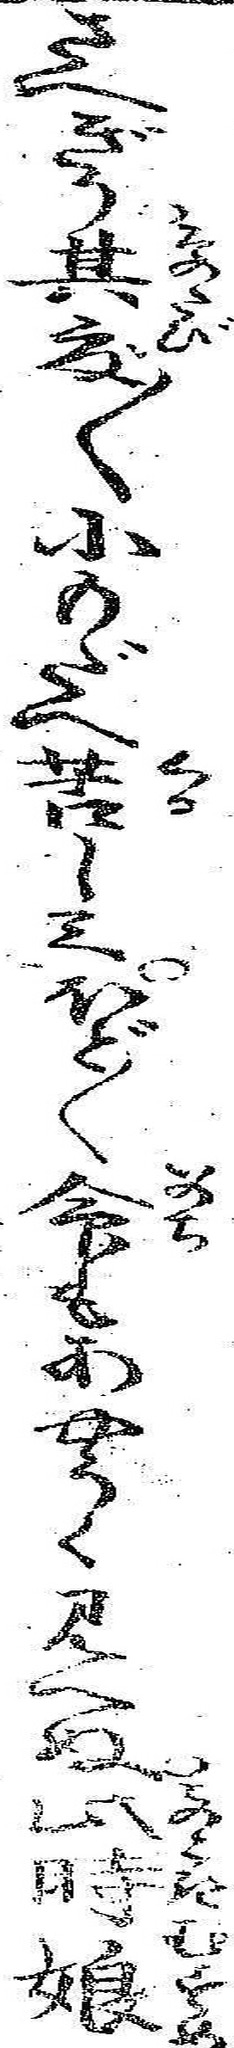さへぎり。其度々にもだへ苦しみ。ほど〳〵命もあやうく見へぬ。此時娘
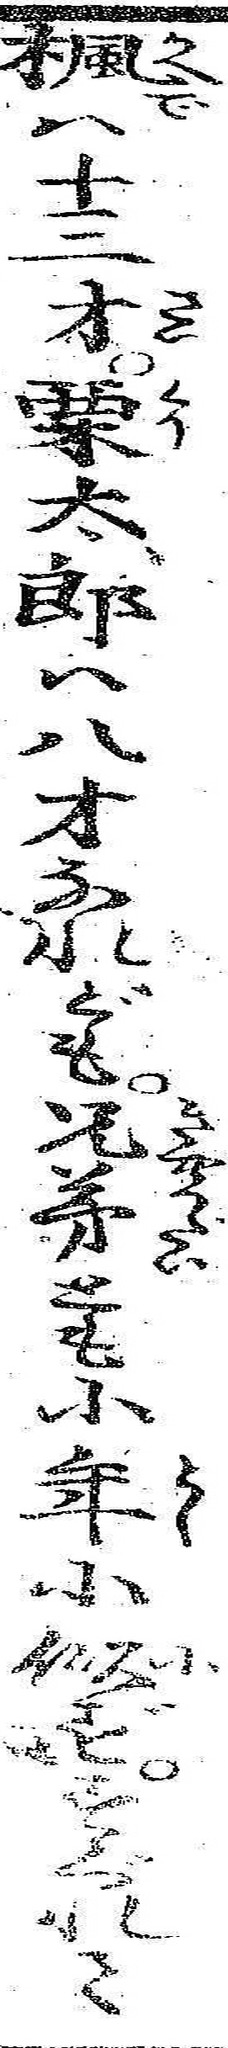楓は十三才。栗太郎は八才なれども。兄弟ともに年に似ず。すぐれて
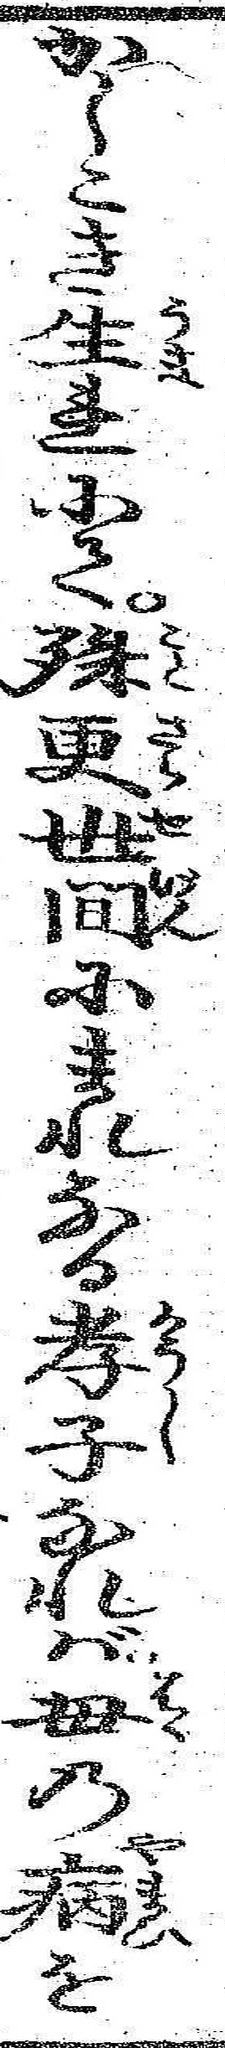かしこき生れにて。殊更世間にまれなる孝子なれば。母の病を
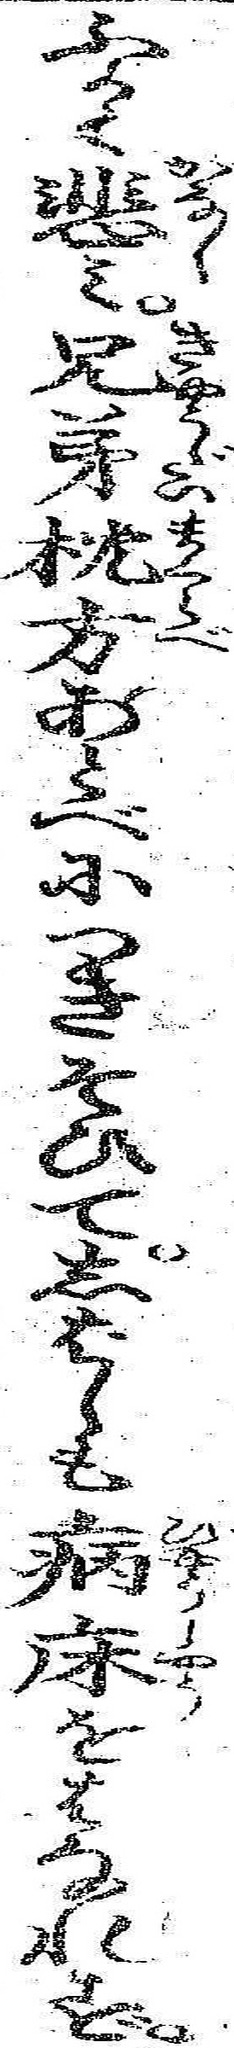ふかく悲み。兄第枕方あとべにつきそひて。しばしも病床をはなれず。
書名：昔話稲妻表紙
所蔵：国文学研究資料館
